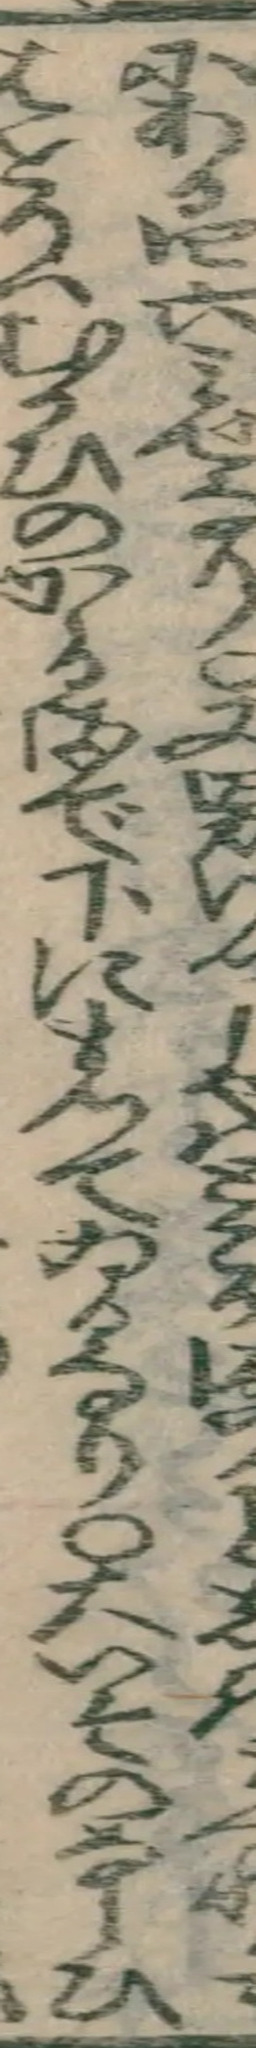はをりはむかひのかるまで下にまつてゐるなり○大いそのならひ
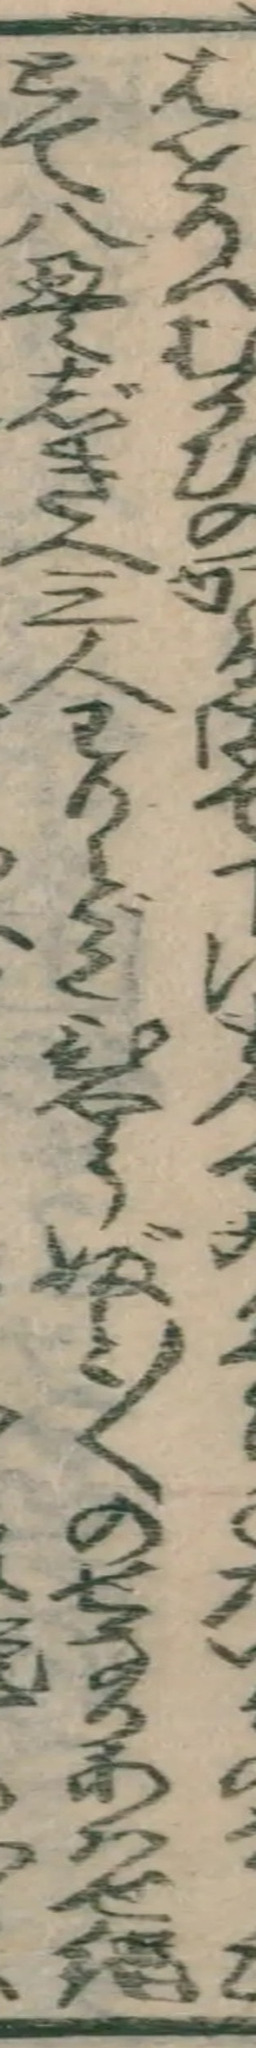とて八畳じきへ三人わりどこひやうぶと〳〵のせなかあはせ紙
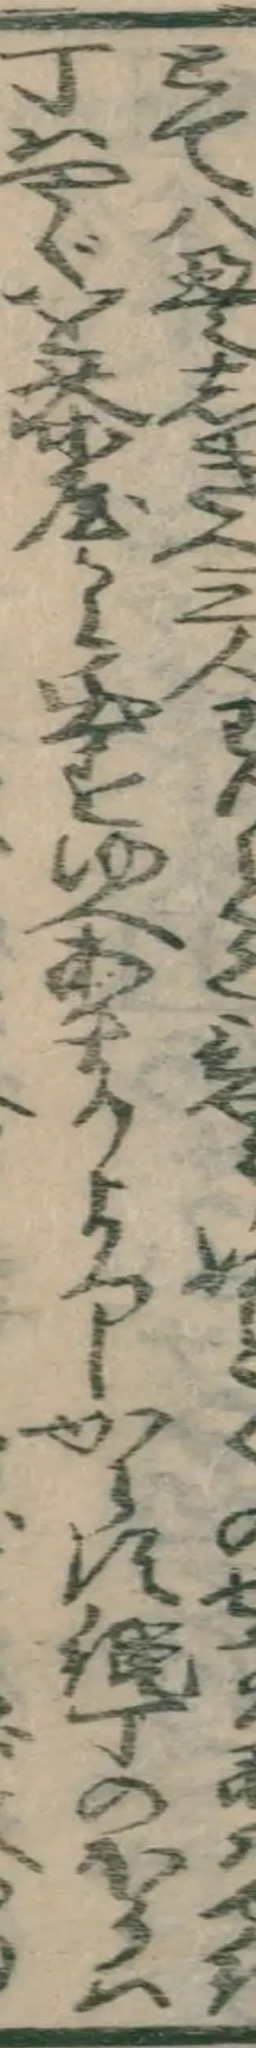丁はやぐを茶屋から出すゆへあまりよりよろしからす縄丁のほうは
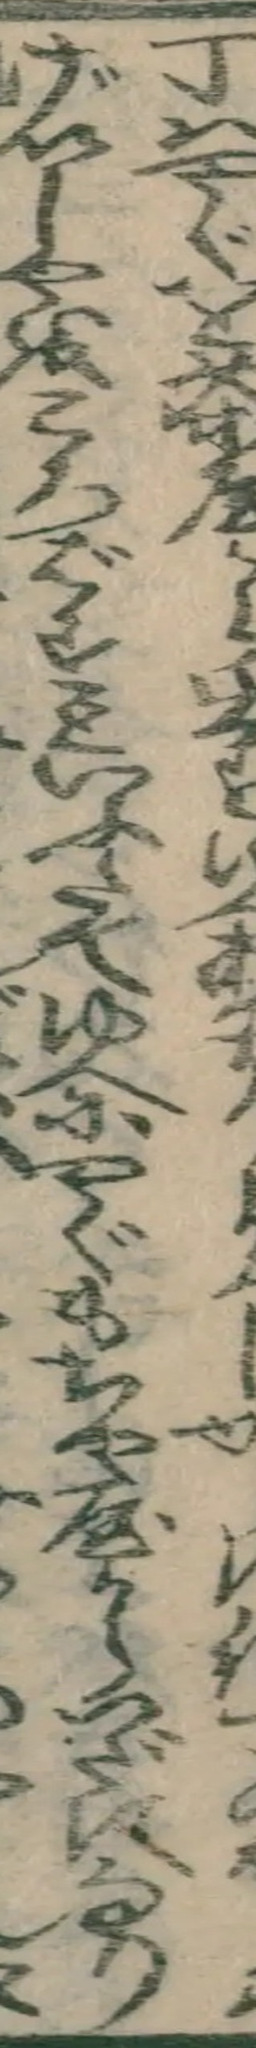げいしやをころばすといふたてゆへにやぐもちや屋からいだすなり
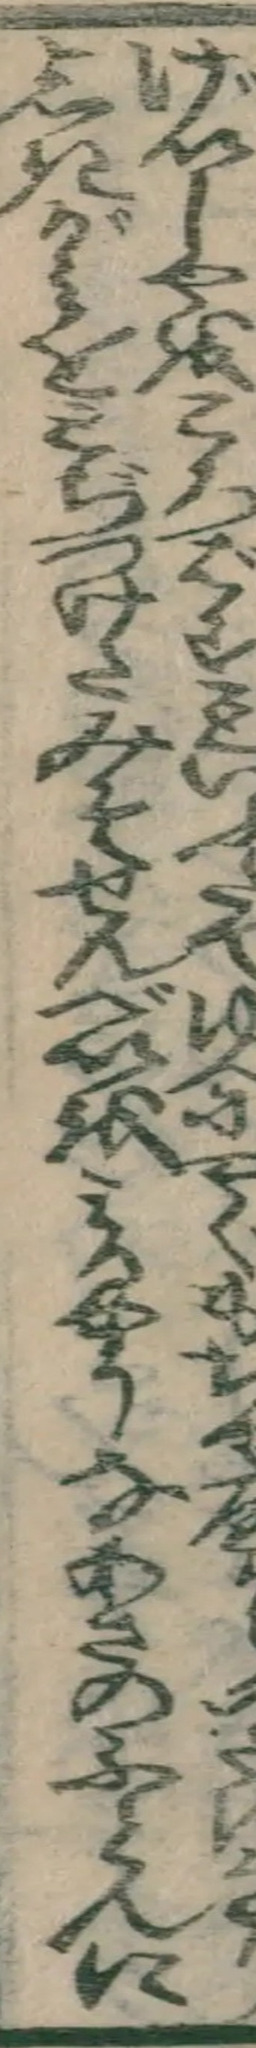しきがみをとぢつけたみそぜんべいをみるやうなあさのふとんに

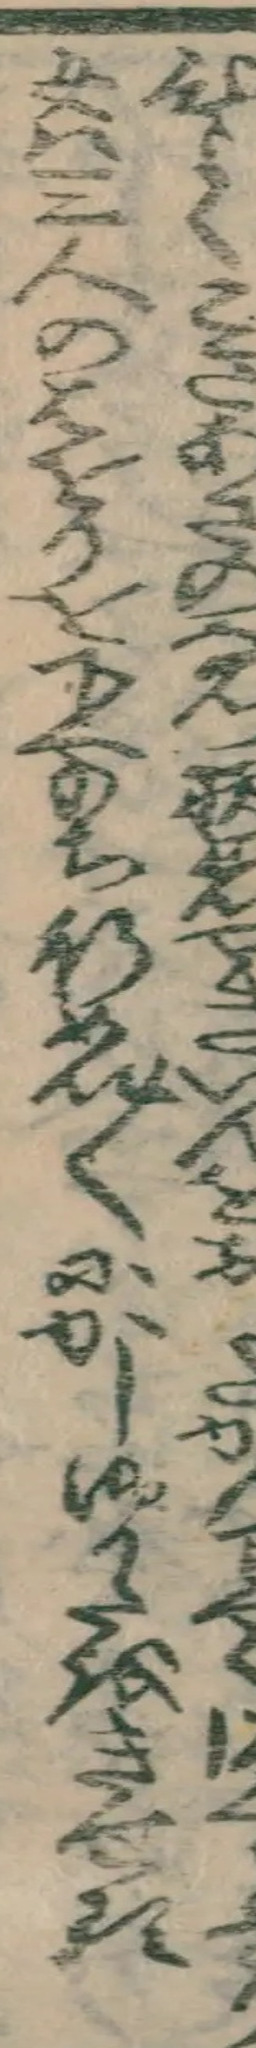女は三人のはをりを下へもち行めい〳〵にかしゆかたをきせる
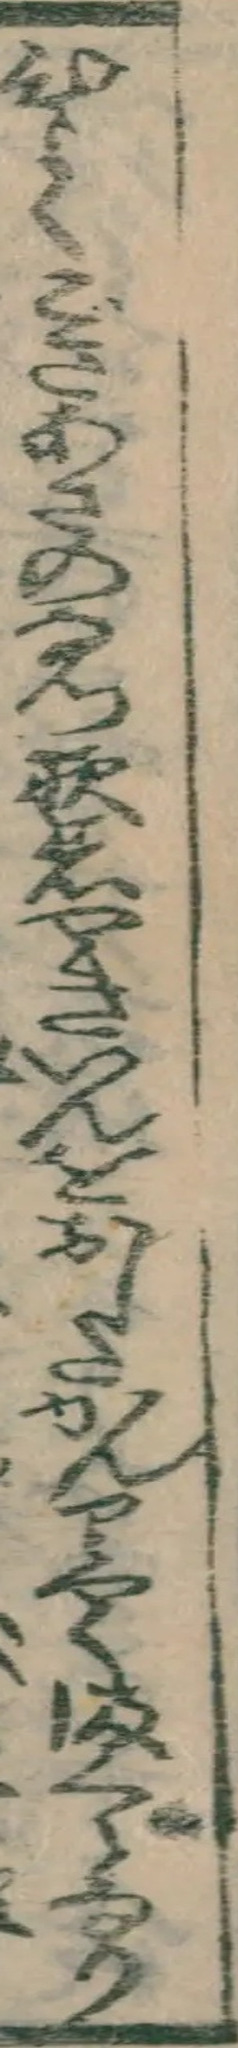ひよくごさあさのなつ夜着やきいんをおしたかんりやくまくらなり
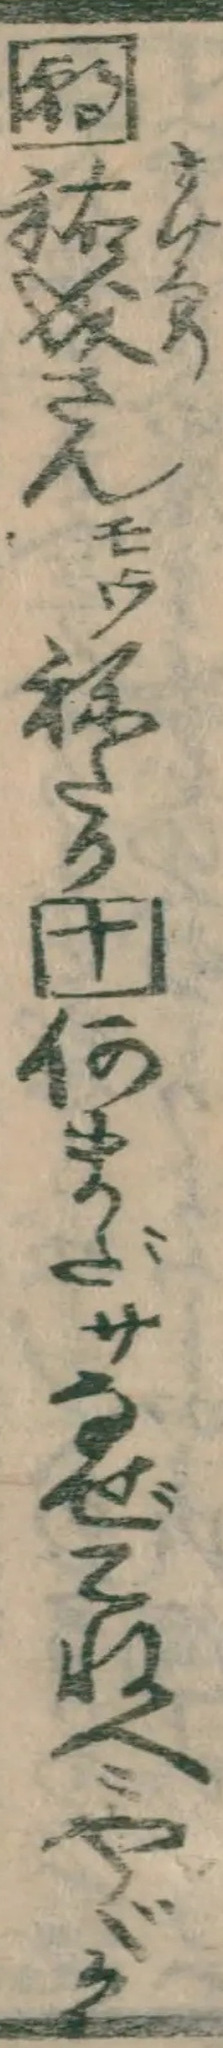〈朝〉祐成さんモウねたり〈十〉何まだサなぜこねへにやぐか
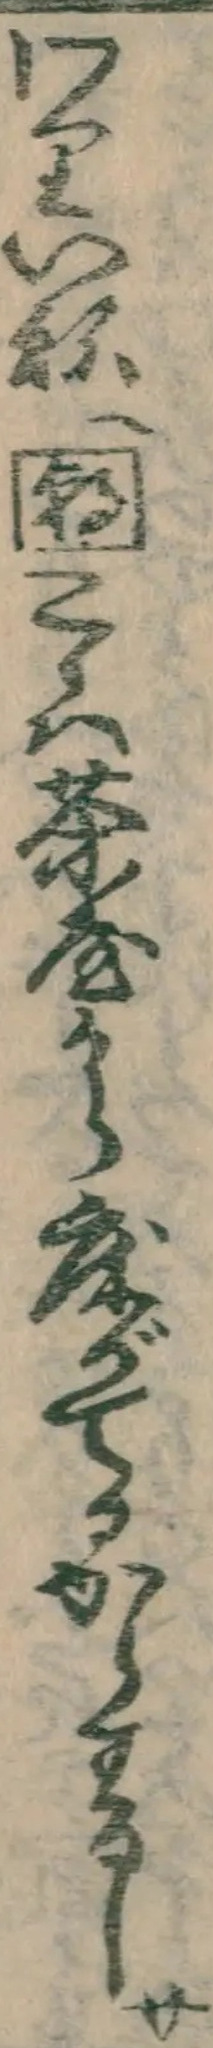わりいねへ〈朝〉こゝは茶屋から床がてるからわるしサ
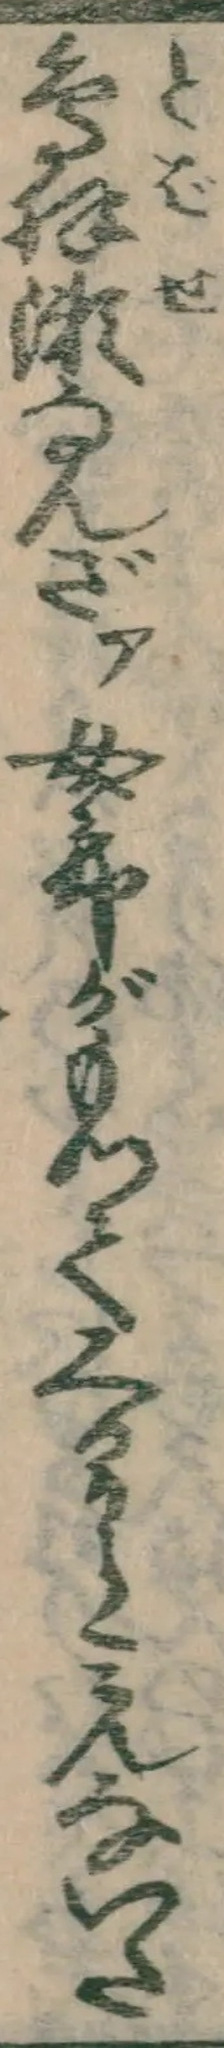鳥羽瀬なんざァ女郎がもつてくるからみんないた
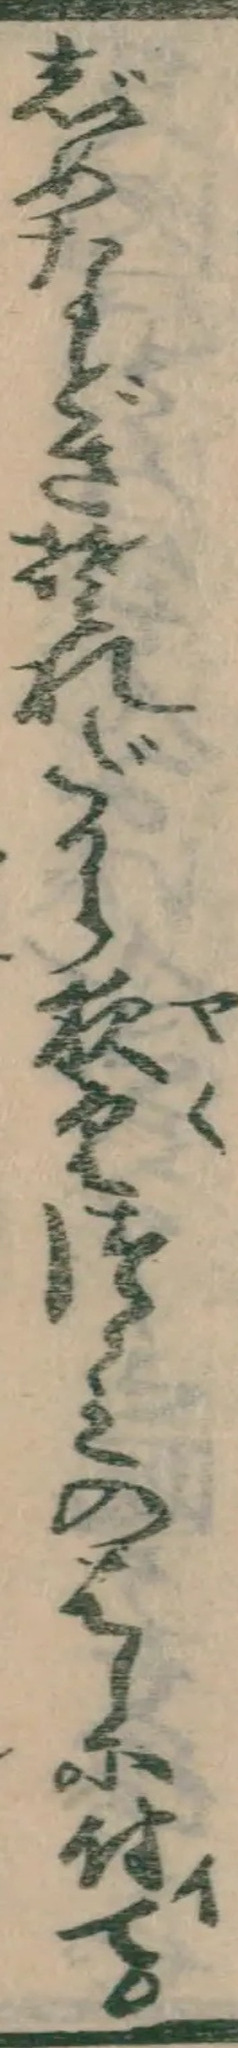じめなどさそれだから夜具つゝみのはしに付いてる
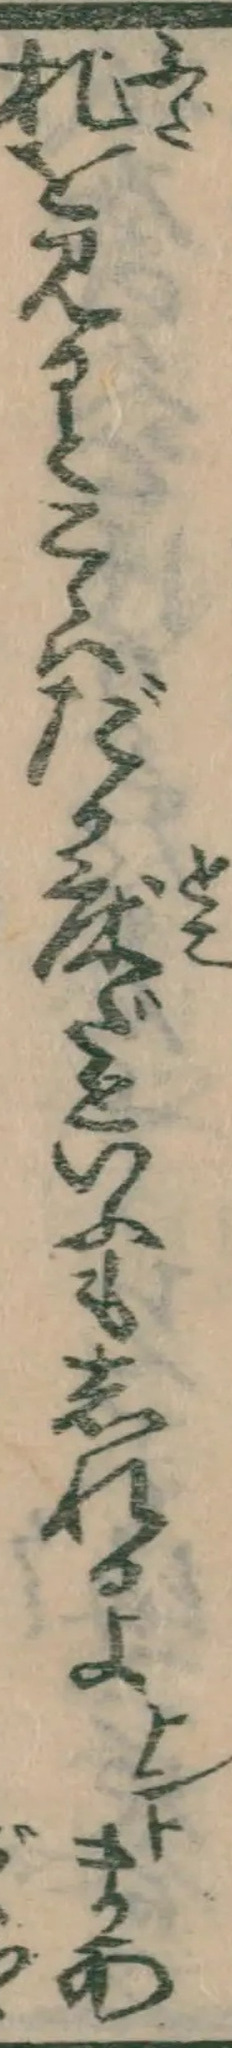札を見るとこゝはだか床だといふもしれるよトントまあ
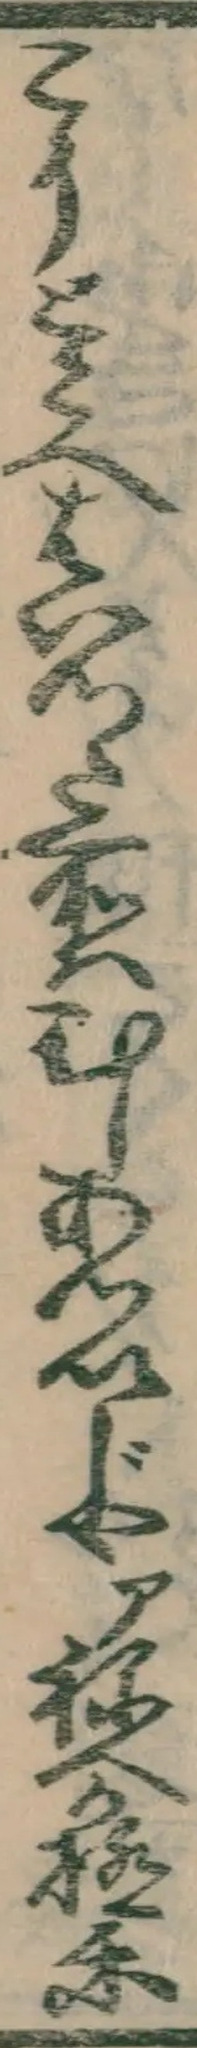こうとこへはいつた所はむしあついじやァねへか極楽
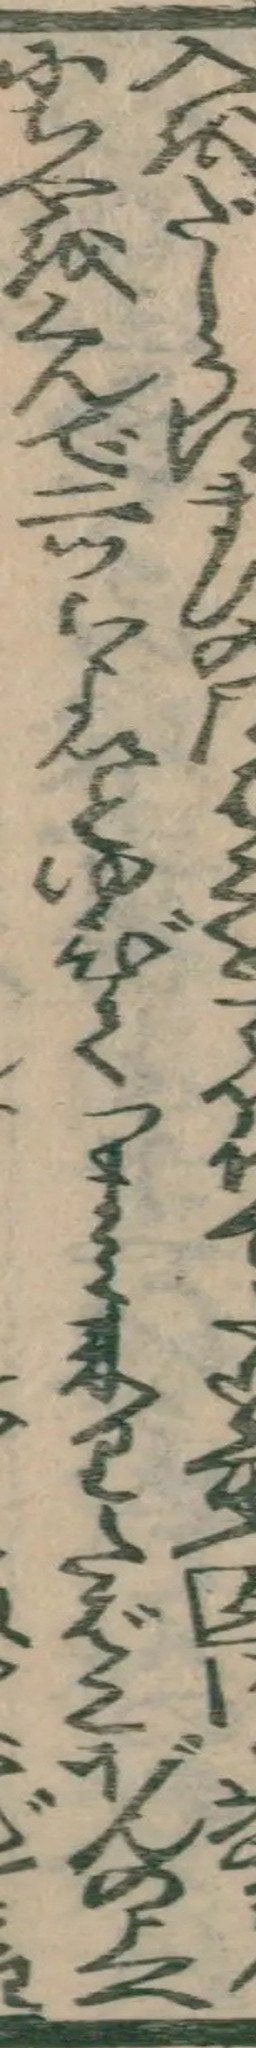にちやをくんで二ツちよいとゆびてつまみ来りたばこぼんの上へ
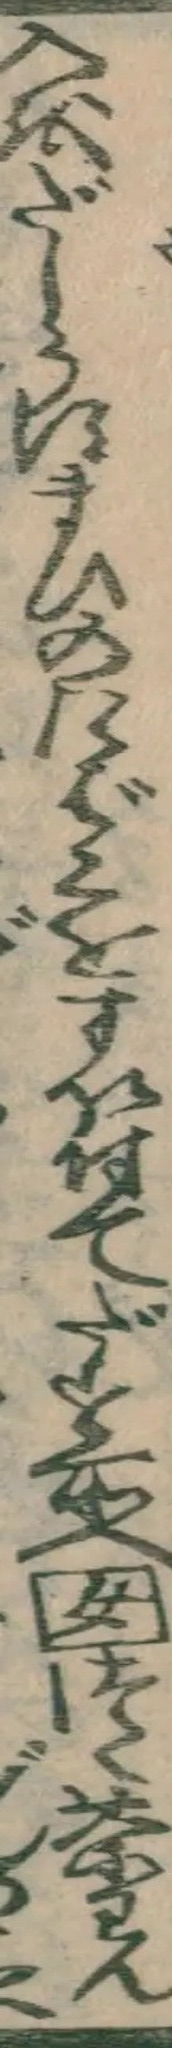入をだしうすまひのたばこをすい付てだす所へ〈女〉つゝ茶わん
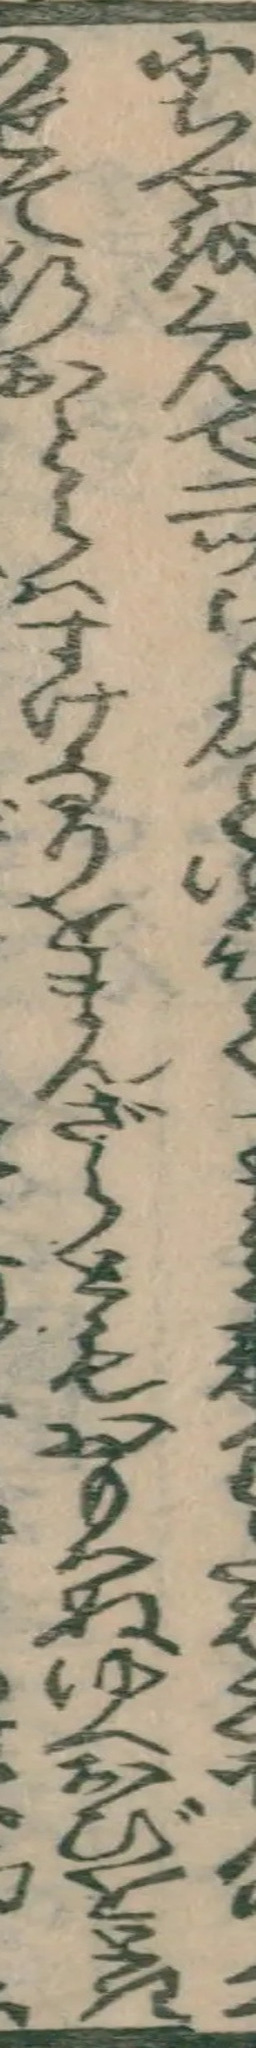のせて行おとらはすけなりをまんざらともおもはぬゆへおびをとき
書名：教訓読本：大礒風俗仕懸文庫
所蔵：国立国会図書館 National Diet Library, JAPAN
